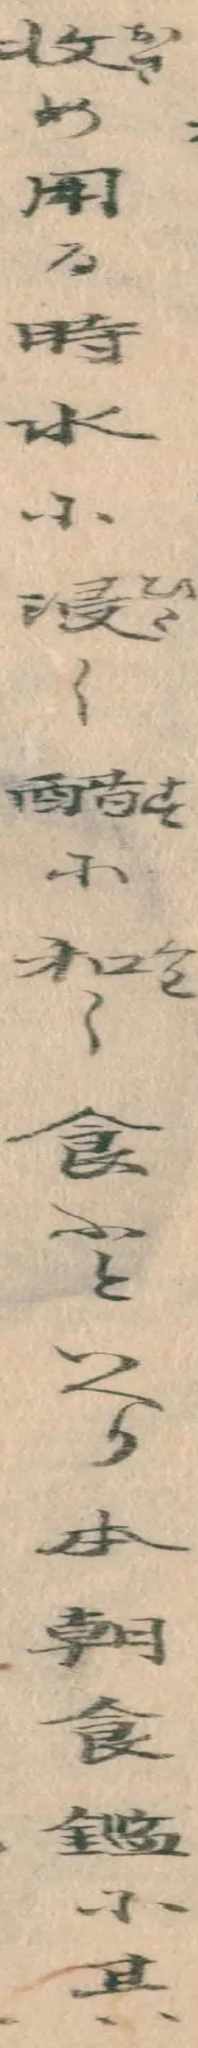収め用る時水に浸し酢に和し食ふといへり本朝食鑑に其
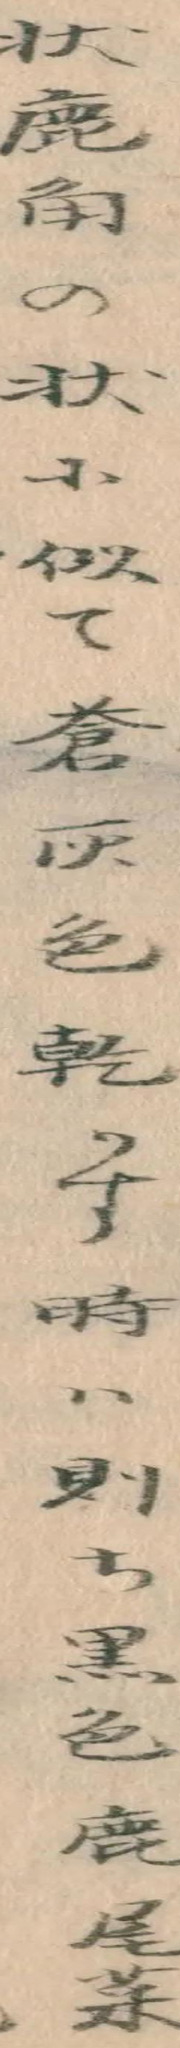状鹿角の状に似て蒼灰色乾かす時は則ち黒色鹿尾菜
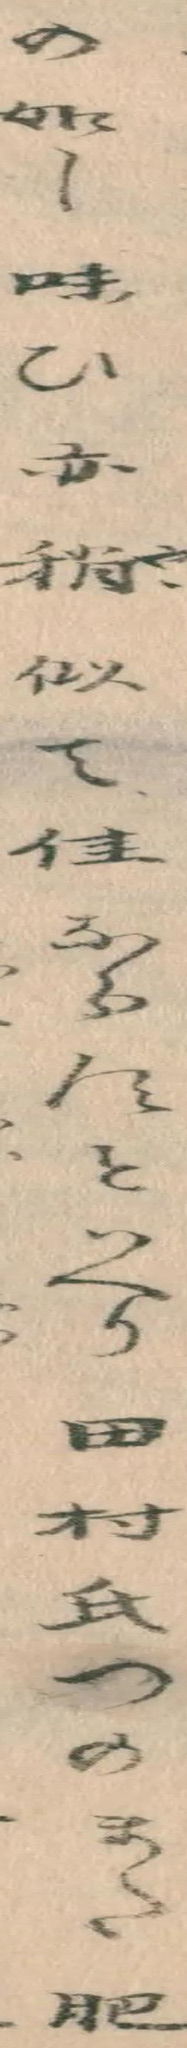の如し味ひ亦稍似て佳ならすといへり田村氏つのまた肥
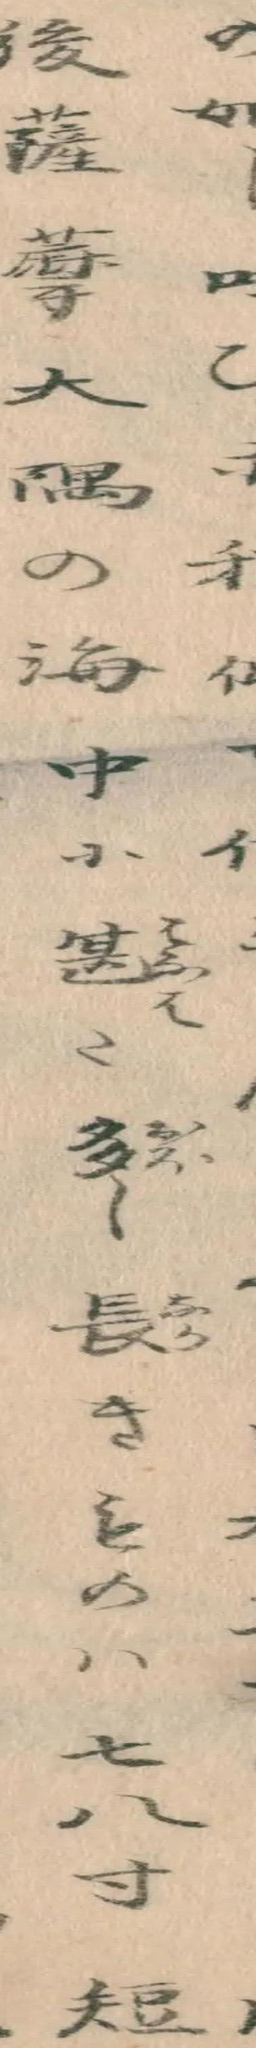後薩藦大隅の海中に甚た多し長きものは七八寸短
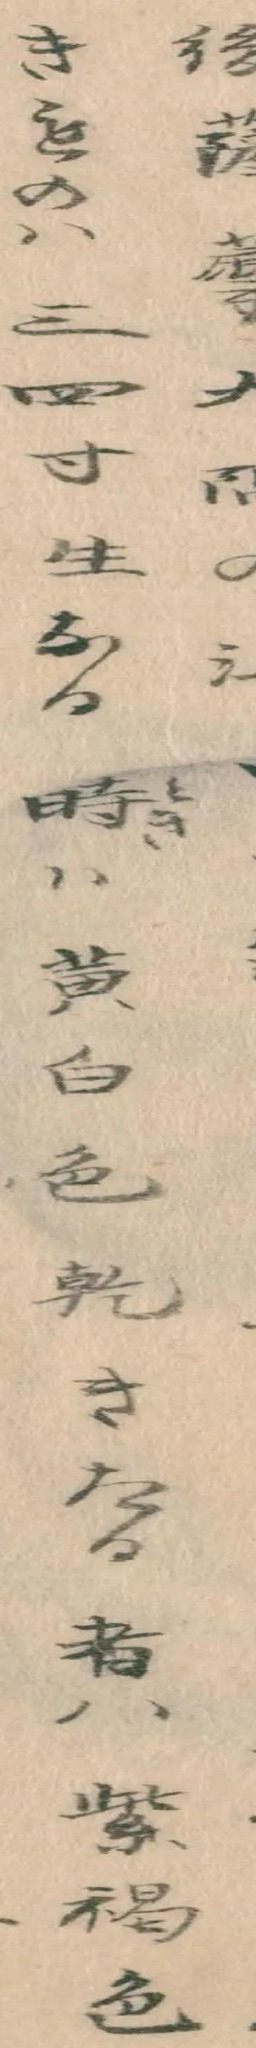きものは三四寸生なる時は黄白色乾きたる者は紫褐色
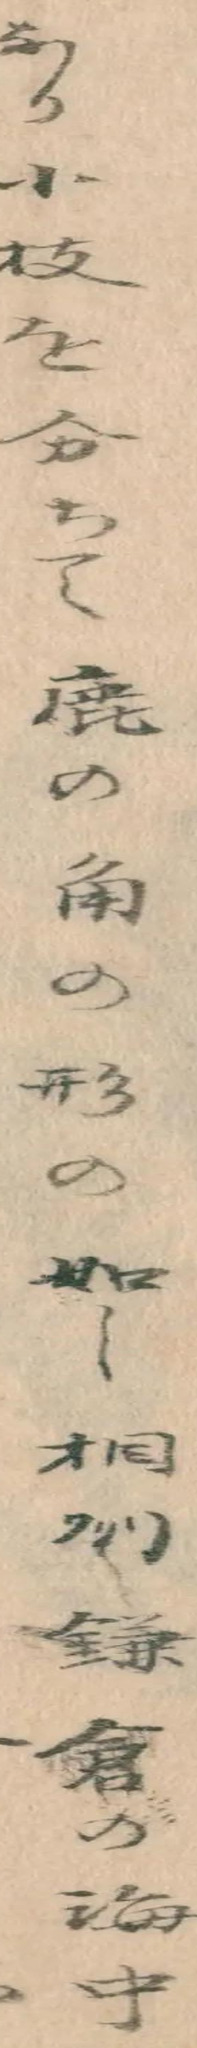なり小枝を分ちて鹿の角の形の如し相州鎌倉の海中
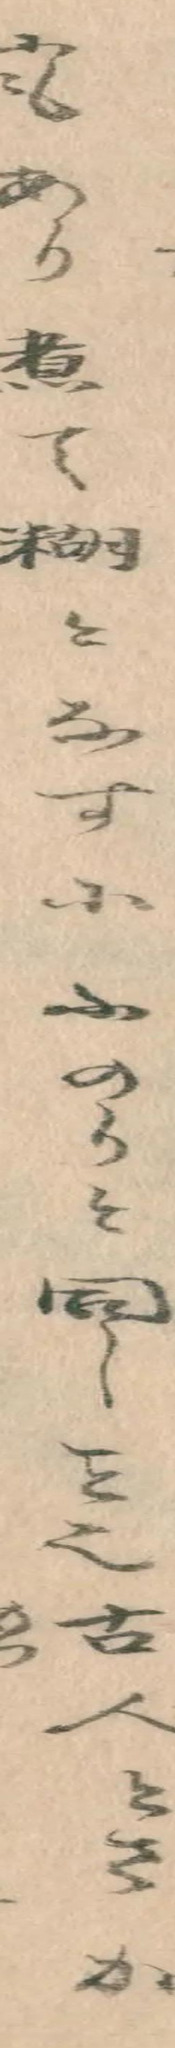にもあり煮て糊となす小ふのりと同しこと也古人とさか
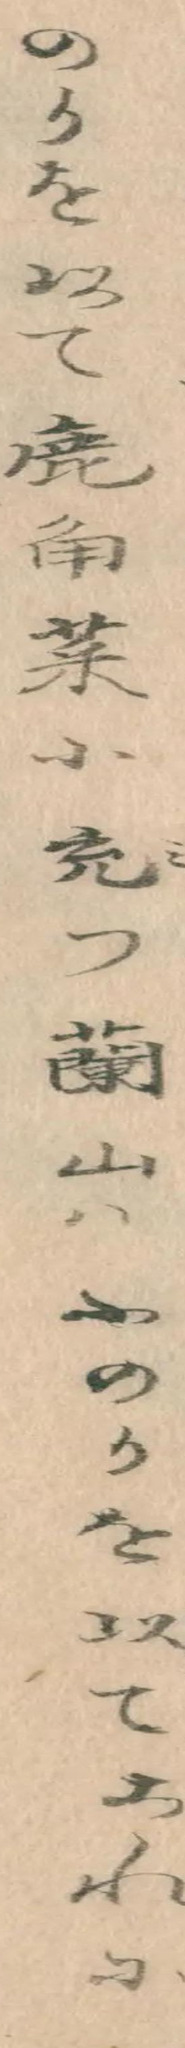のりを以て鹿角菜に充つ蘭山はふのりを以てこれに
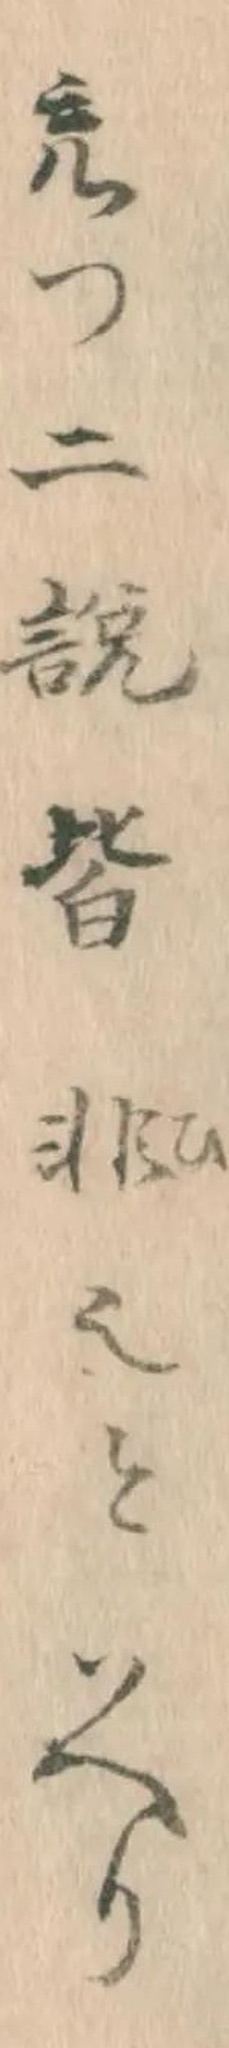充つ二説皆非也といへり

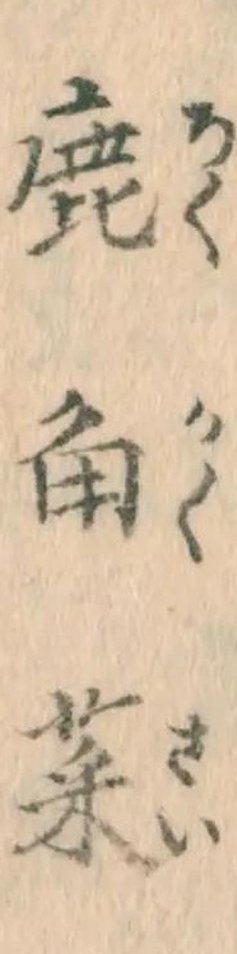鹿角菜

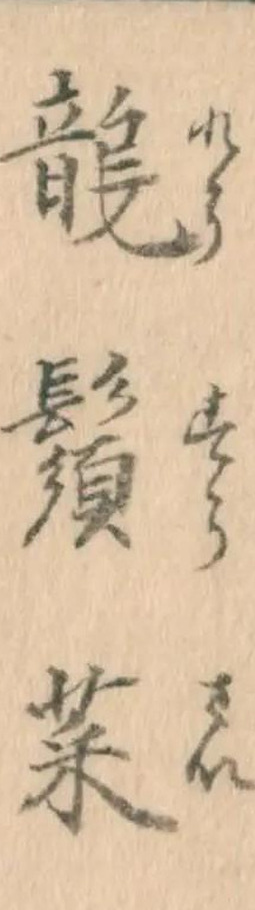竜鬚菜
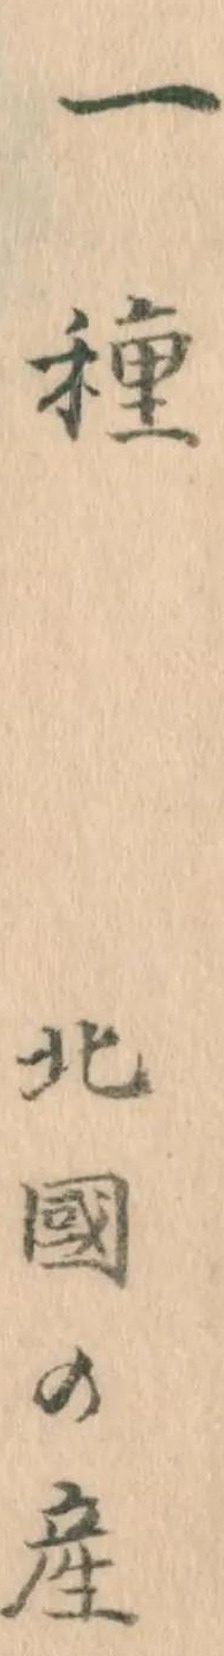一種北国の産
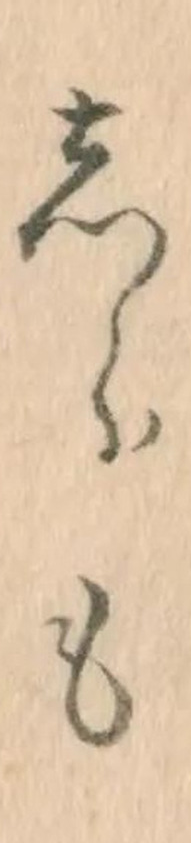しらも
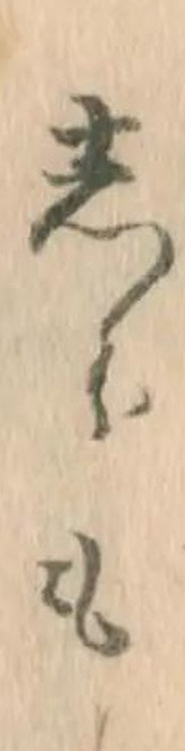しらも
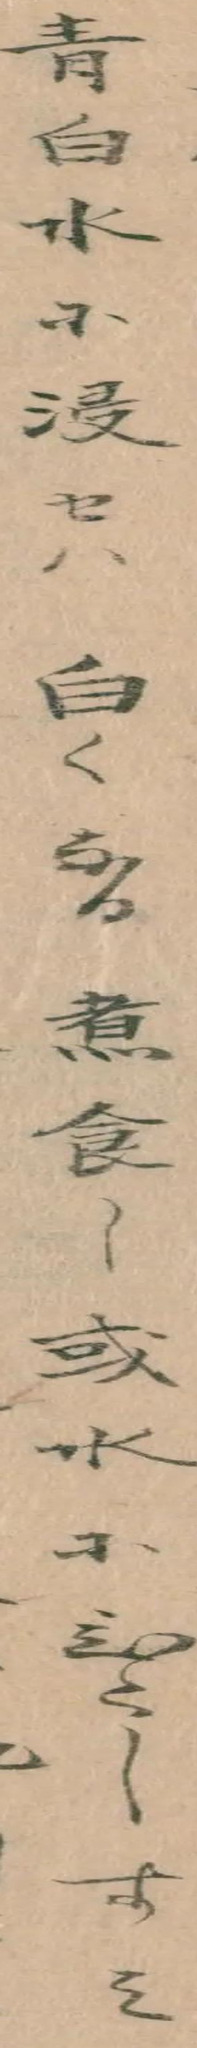青白水に浸せは白くなる煮食し或水にひたしすみ
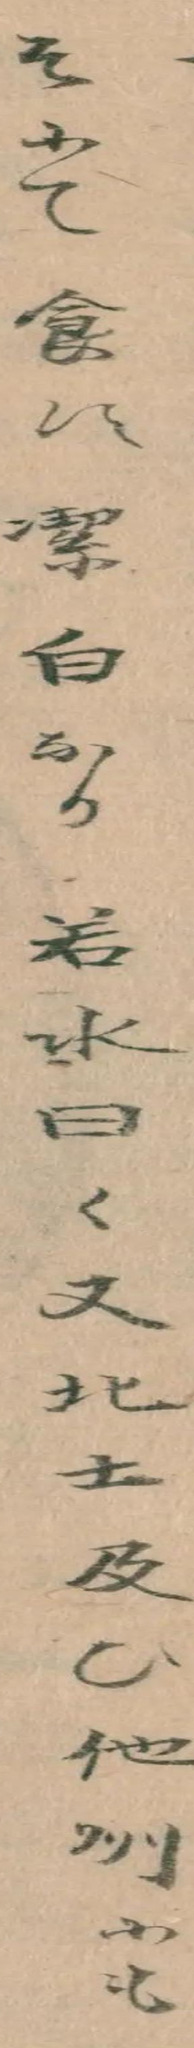そにて食す潔白なり若水曰く又北土及ひ他州にも
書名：本草図譜. 巻52-54
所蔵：国立国会図書館 National Diet Library, JAPAN
